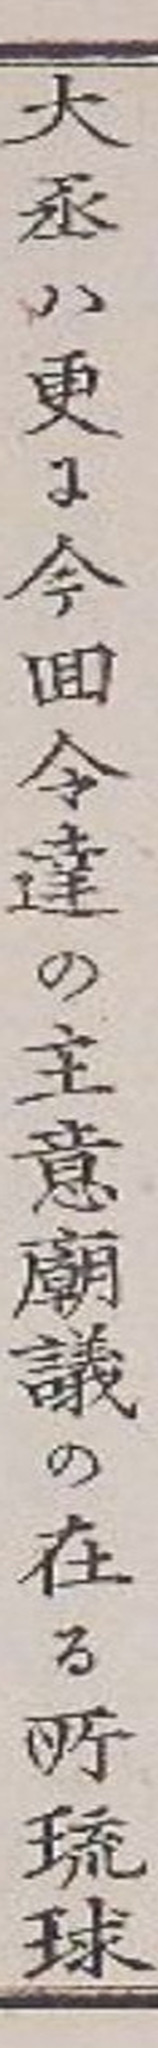大丞は更に今回令達の主意廟議の在る所琉球
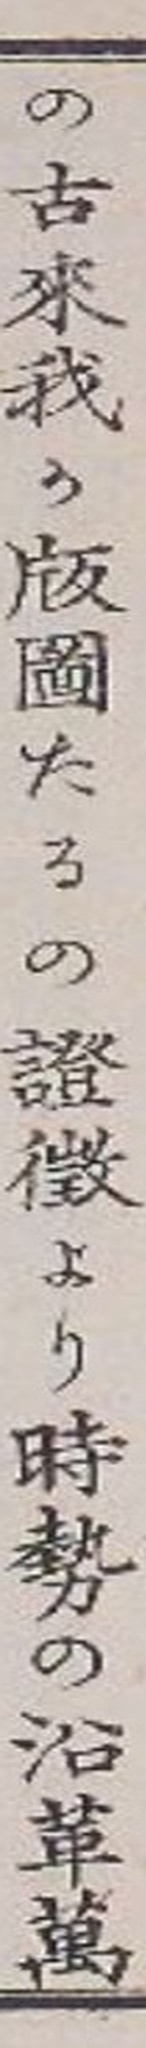の古来我か版図たるの証徴より時勢の沿革万
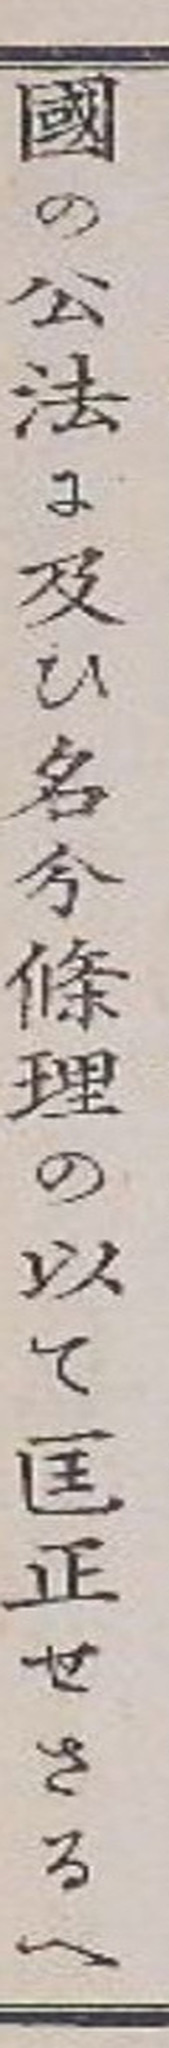国の公法に及ひ名分条理の以て匡正せさるへ
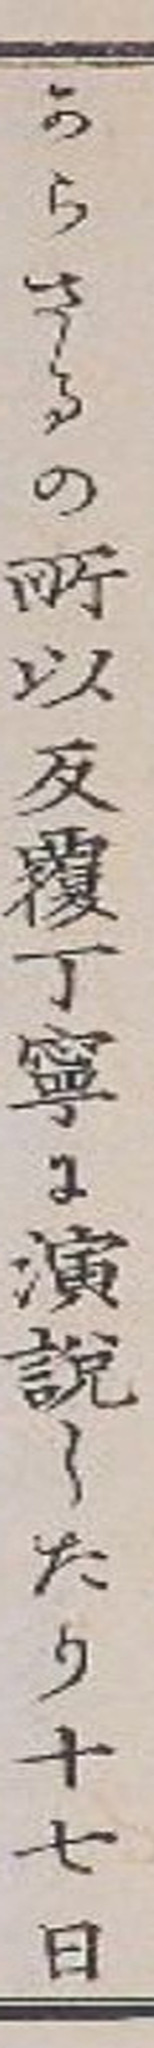からさるの所以反覆丁寧に演説したり十七日
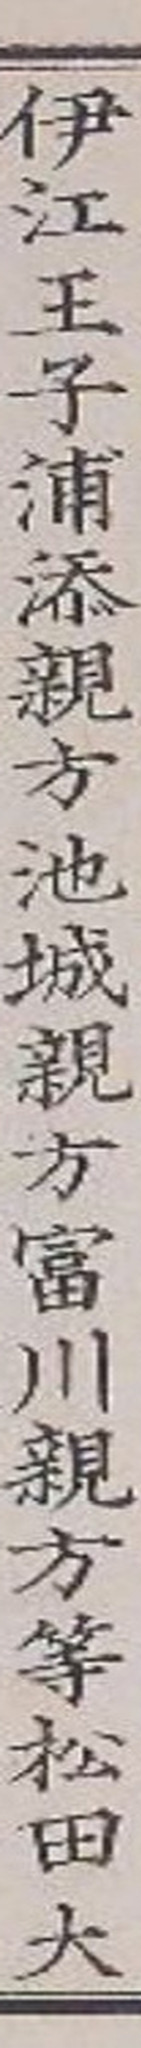伊江王子浦添親方池城親方富川親方等松田大
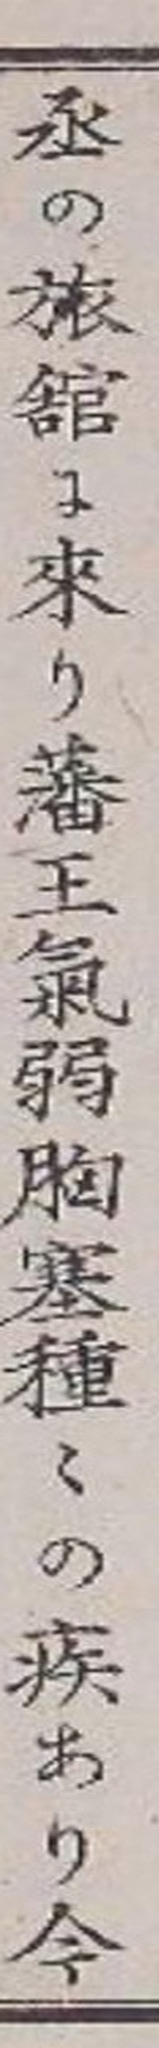丞の旅館に来り藩王気弱胸塞種々の疾あり今
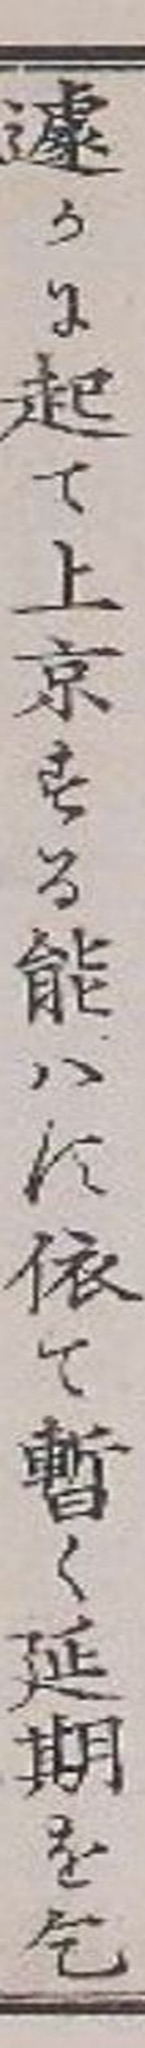遽かに起て上京する能はす依て暫く延期を乞
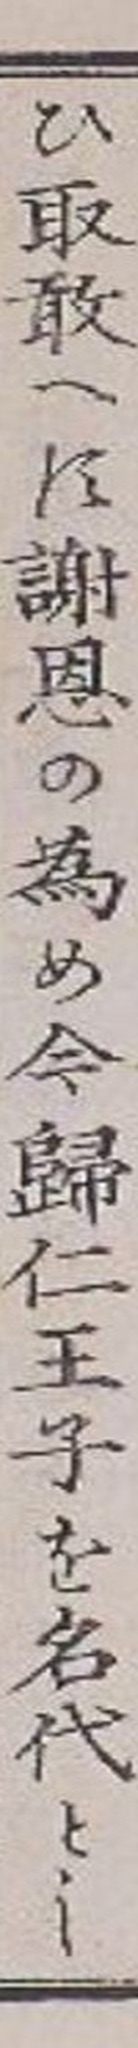ひ取敢へす謝恩の為め今帰仁王子を名代とし

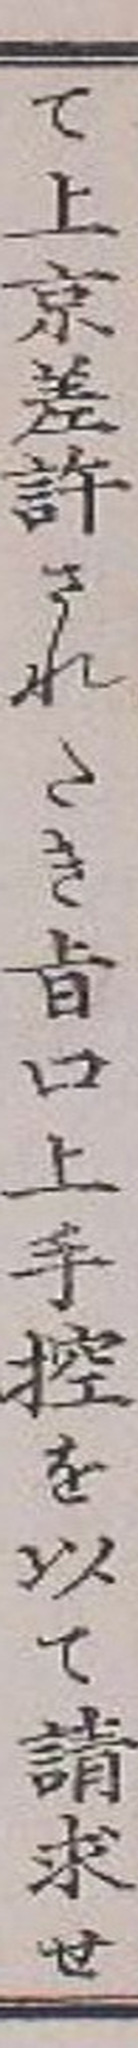て上京差許されたき旨口上手控を以て請求せ
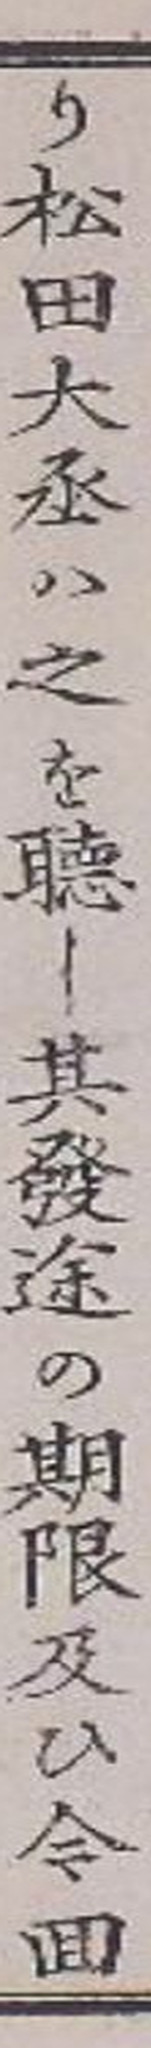り松田大丞は之を聴し其発途の期限及ひ今回
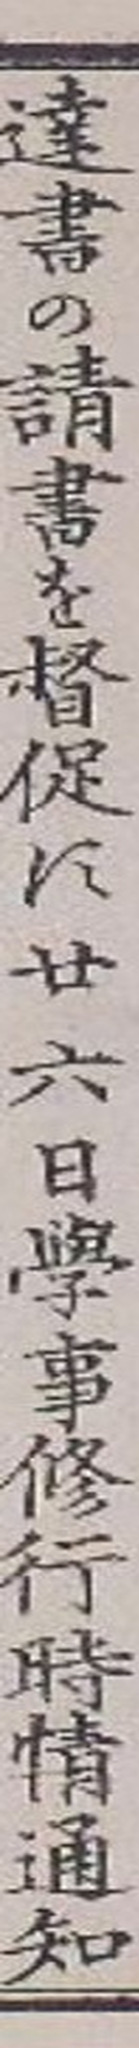達書の請書を督促す廿六日学事修行時情通知
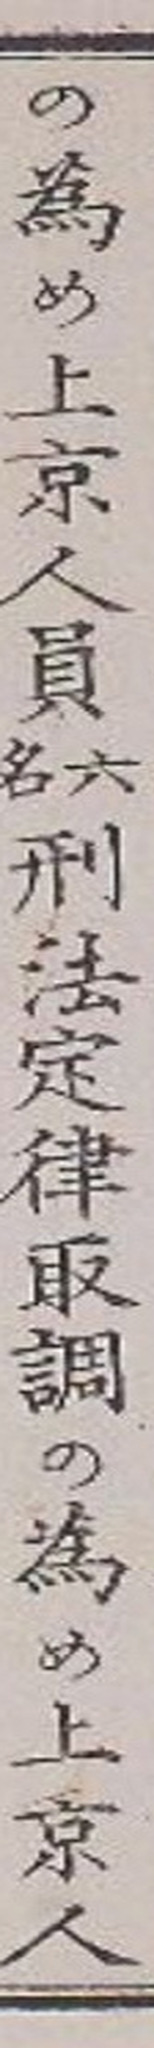の為め上京人員六名刑法定律取調の為め上京人
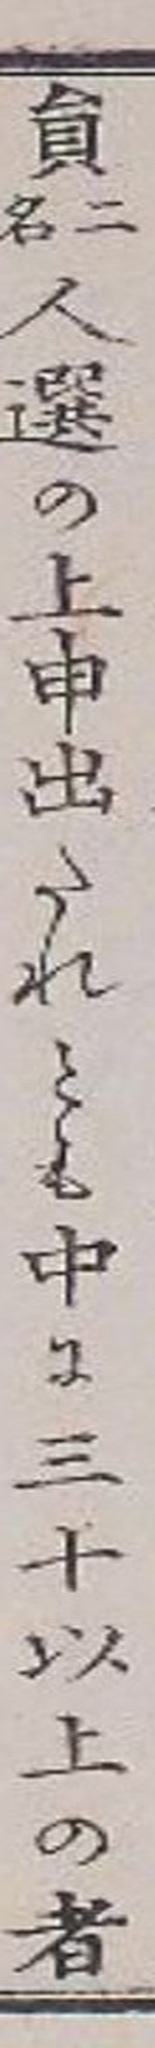員二名人選の上申出たれとも中に三十以上の者
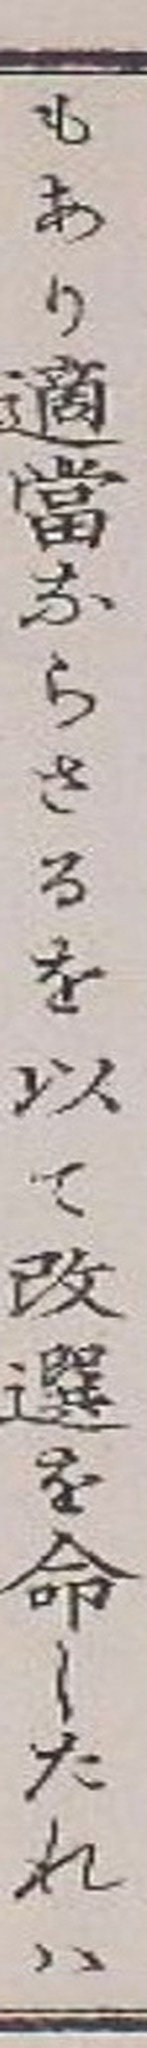もあり適当ならさるを以て改選を命したれは
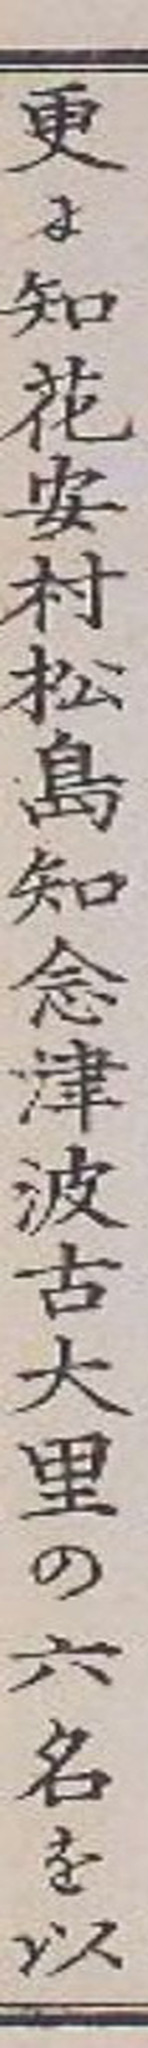更に知花安村松島知念津波古大里の六名を以
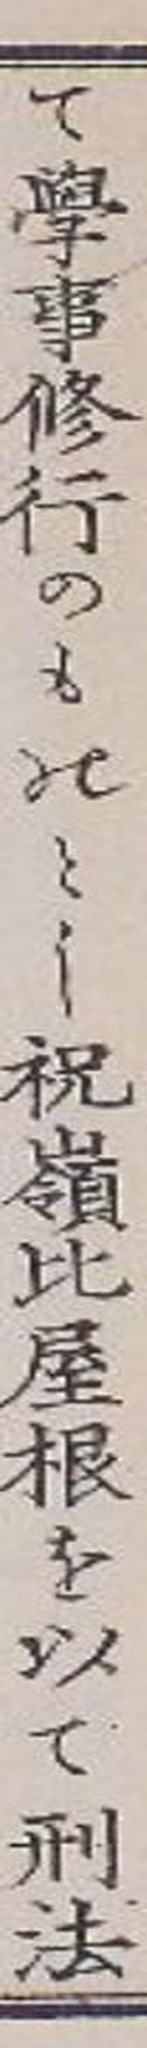て学事修行のものとし祝嶺比屋根を以て刑法
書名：南島紀事 下
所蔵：University of the Ryukyus Library
